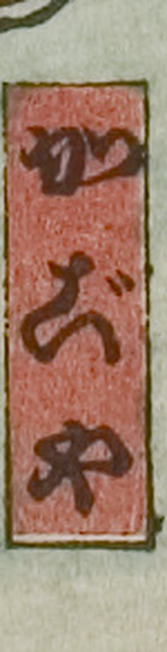かごや
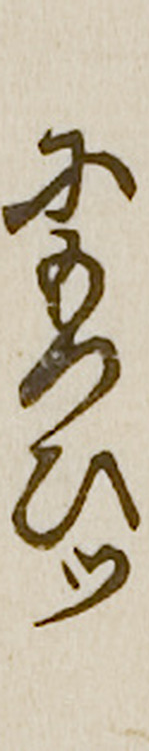にもつひっ
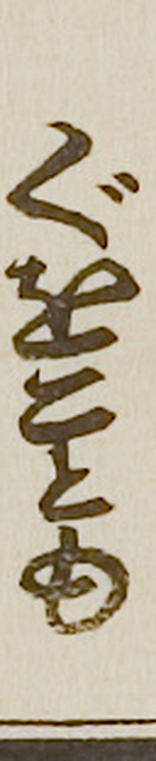ぐをことも
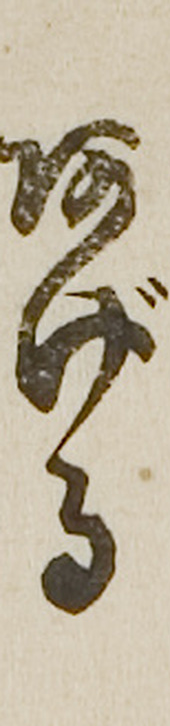あげる
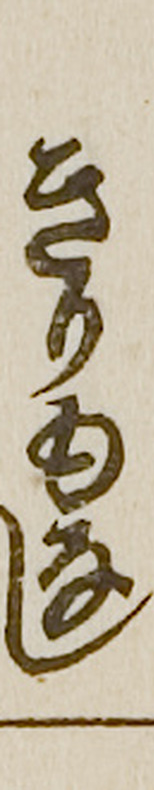きりもなし
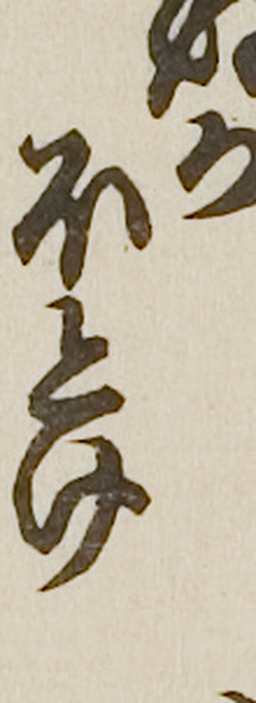ほとけ
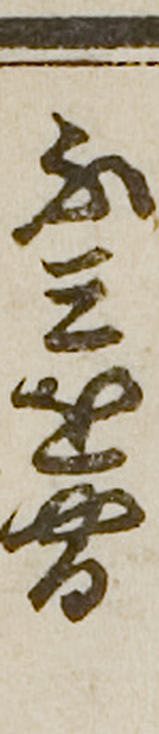ふみをやる
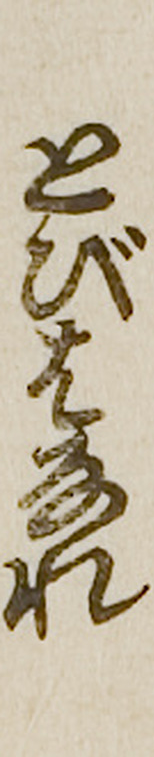とびはなれ
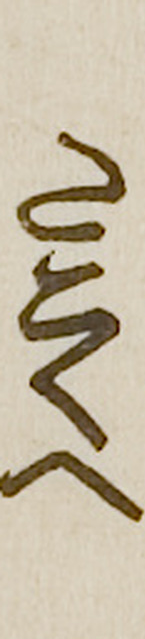たこくへ
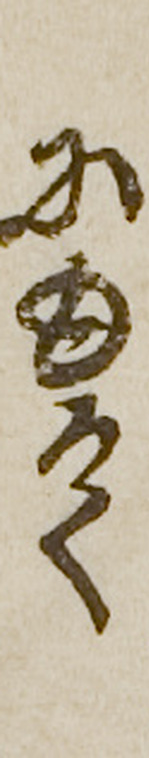にもかく
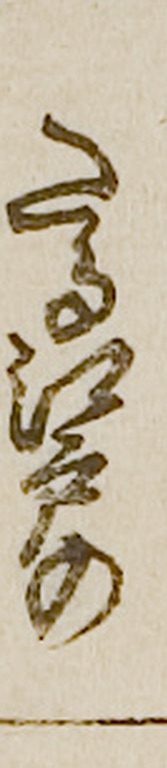たる江戸の
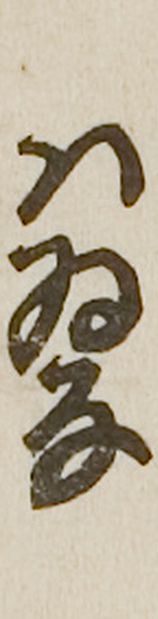はゐな
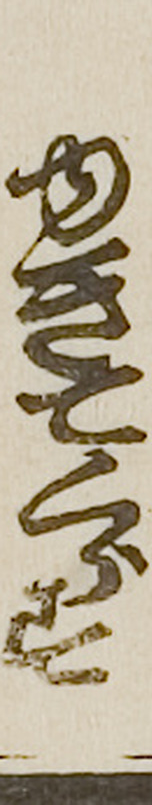ゆきてくらす
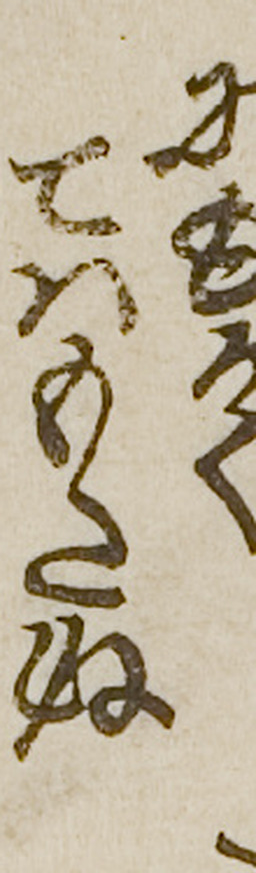てはもたぬ
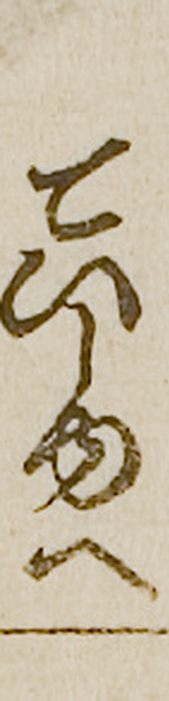ていしゆへ
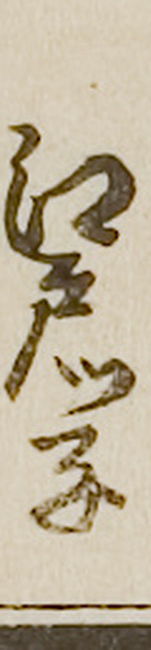江戸ッ子
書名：当時流行いろは壁
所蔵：東京大学総合図書館 General Library in the University of Tokyo, JAPAN
